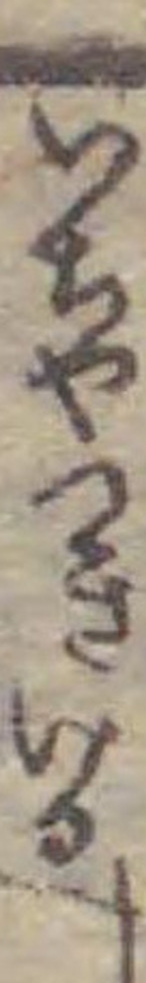いちやつきける
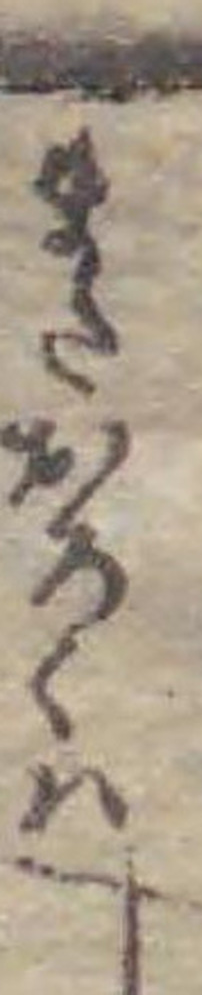またおろくは
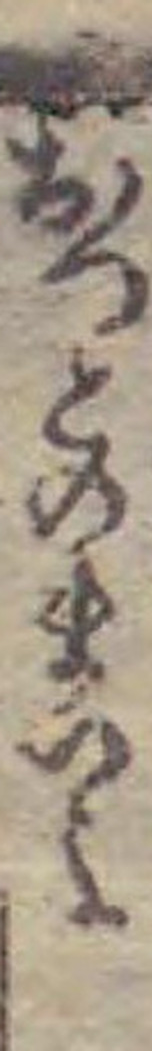おつとのまいよ
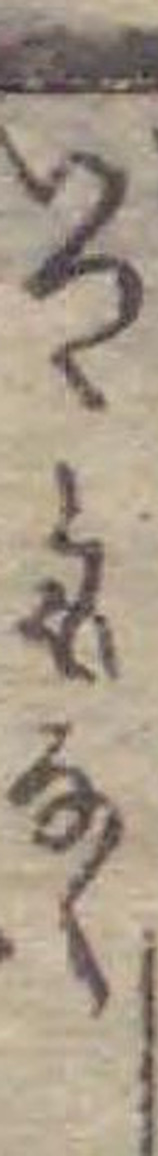いつくともなく
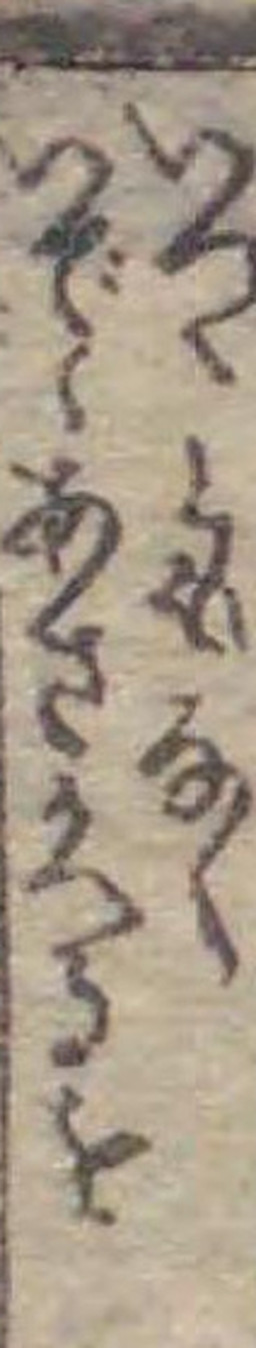いでゝあさかへるを
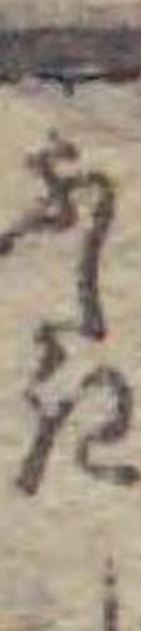ふしぎ
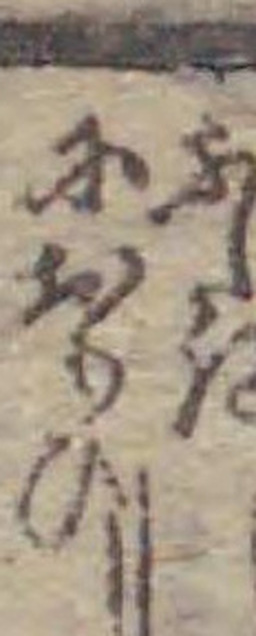におもひ
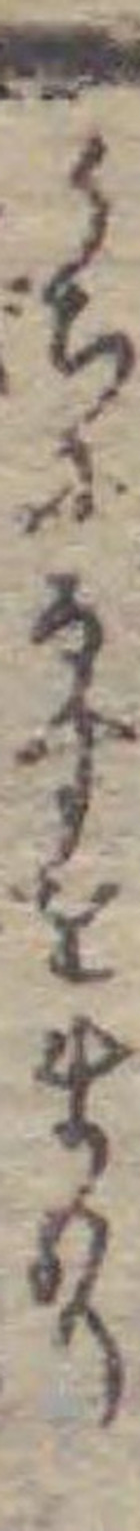うちにるすをまもり
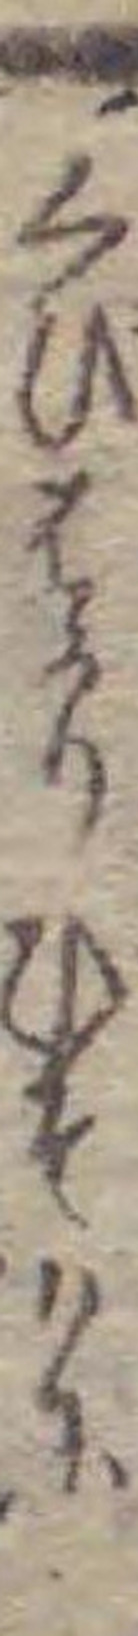くびはかりひそかに
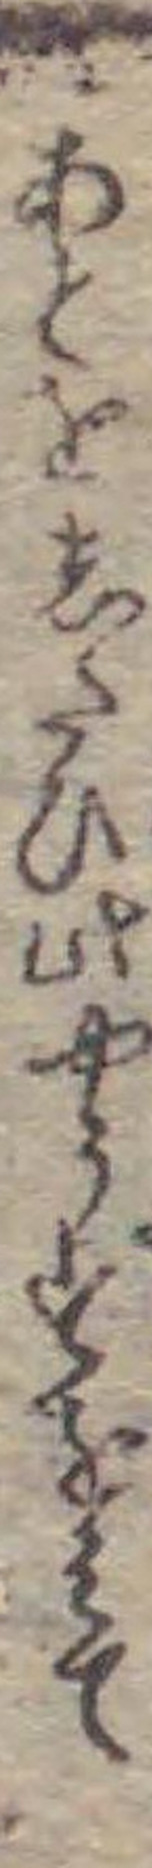あとをしたひ此やうすをみて
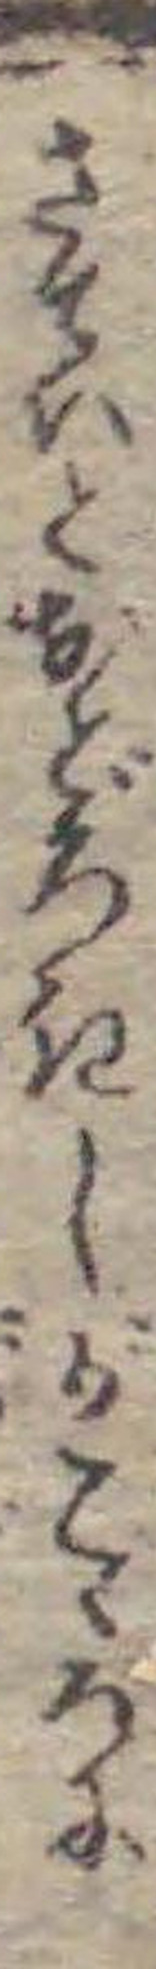さてはとおどろきしがこゝろに
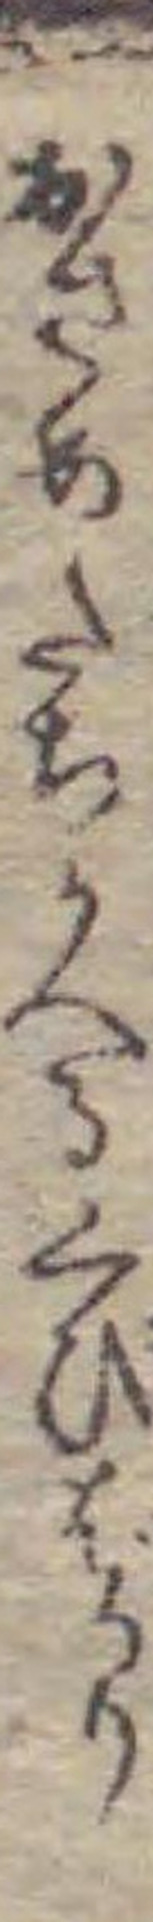おさめたちかえるくびばかり
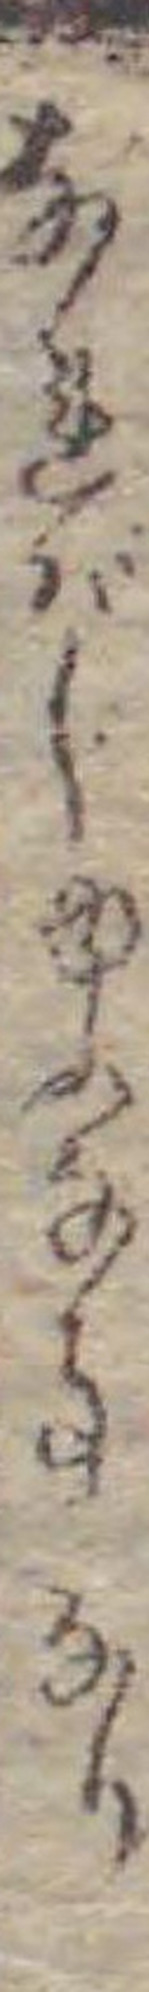なればじゆふな事なり
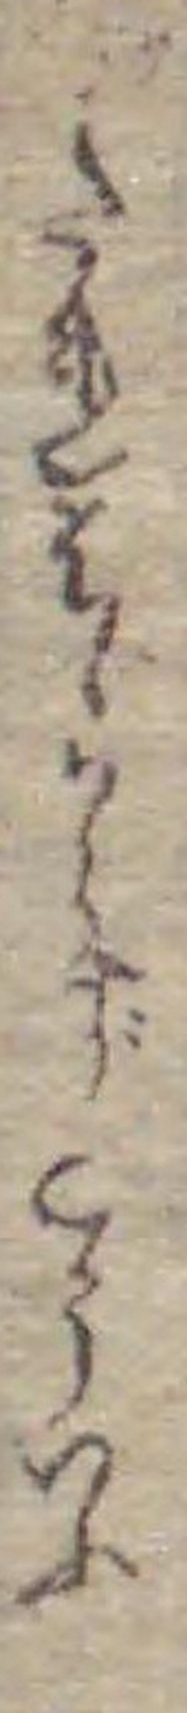たれはゝからずこういふ
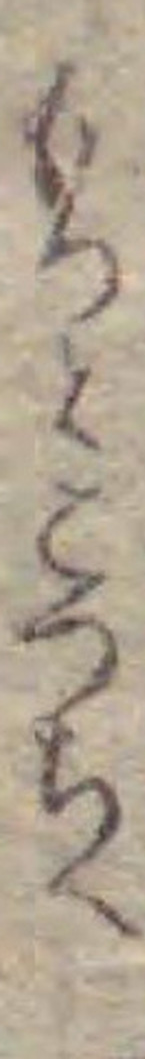もつとこつちへ
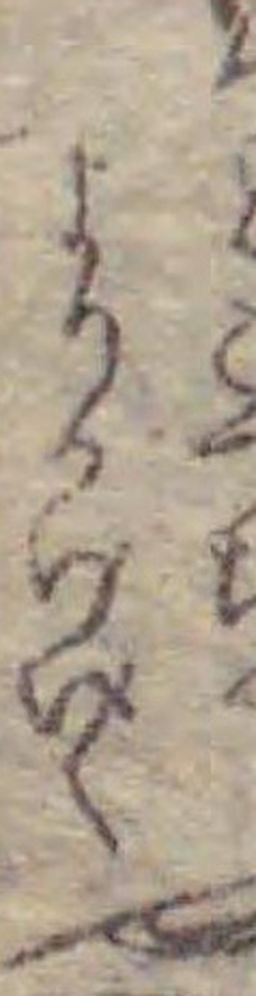よりかけい〳〵
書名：[化物一代記] : 5巻
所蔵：国立国会図書館 National Diet Library, JAPAN
